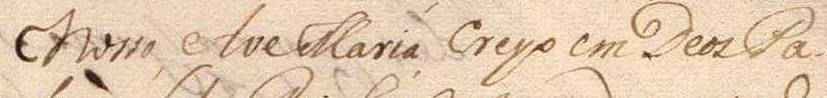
Nosso, Ave Maria, Creyo em Deos Pa
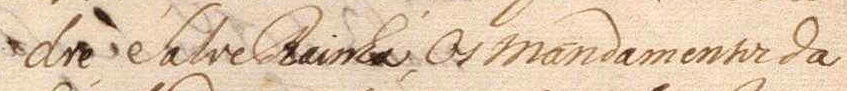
dre, Salve Rainha, os mandamentos da
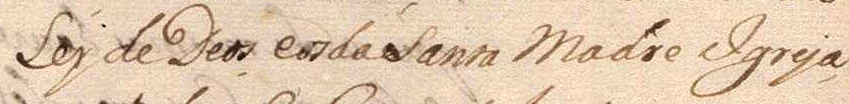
Ley de Deos, e os da Santa Madre Igreja,
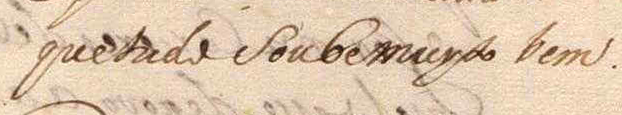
que tudo soube muyto bem.
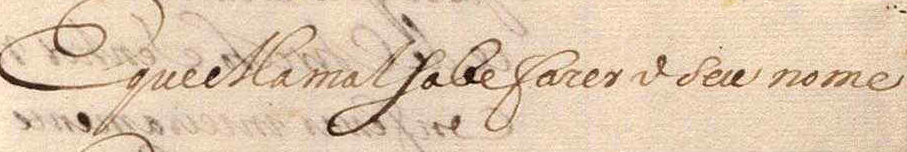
E que ella mal sabe fazer o seu nome
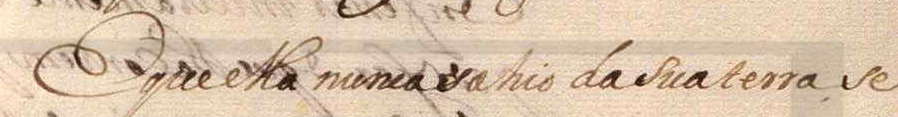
E que ella nunca sahio da sua terra se
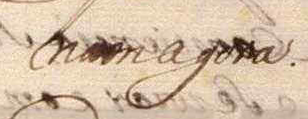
nam agora.
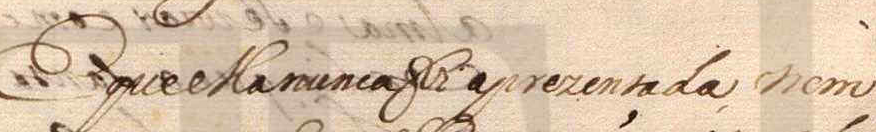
E que ella nunca foi aprezentada, nem
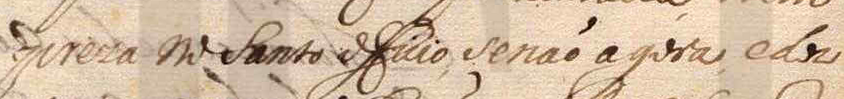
preza no Santo officio senaõ agora e doz
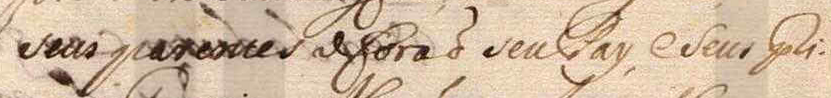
seus parentes e foraõ seu Pay, e seus pRi
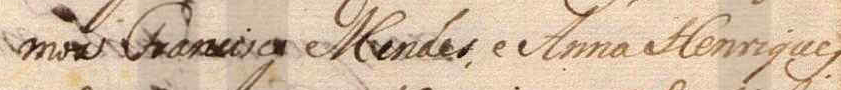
moz Francisco Mendes, e Anna Henriques
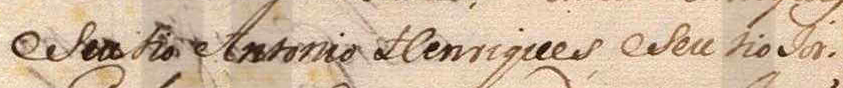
e seu tio Antonio Henriques, e seu tio Ior
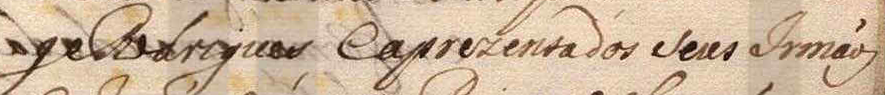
ge Rodrigues, e aprezentados seus Irmaõs
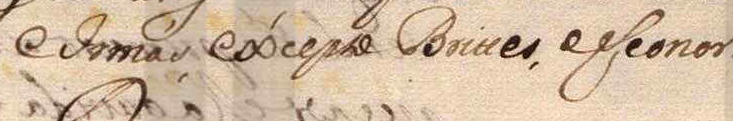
e Irmão, excepto Brittes, e Leonor
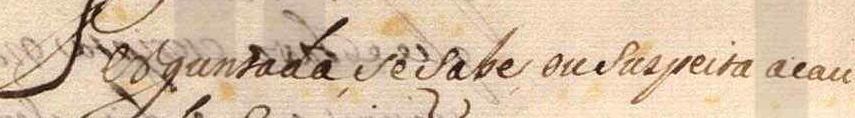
Perguntada, se sabe ou suspeita a cau
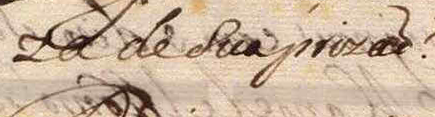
za de sua prizaõ?
